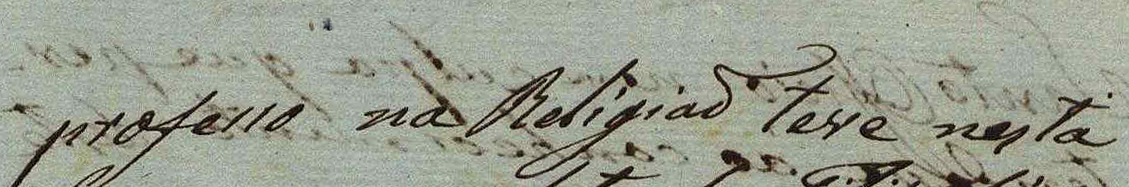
professo na Religiaõ teve nesta
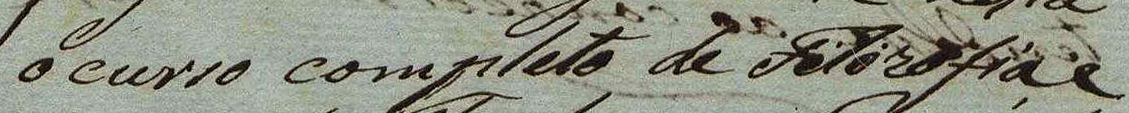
o curso completo de Filozofia, e
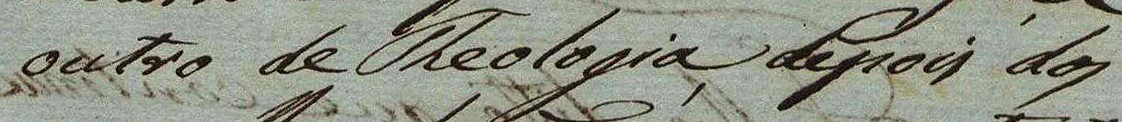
outro de Theologia, depois dos
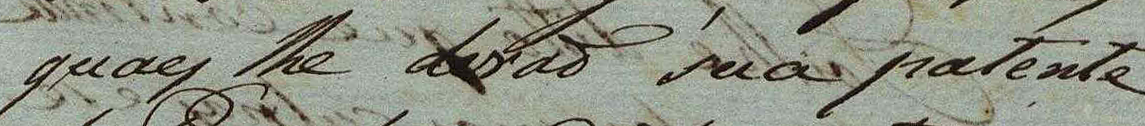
quaes lhe deraõ sua patente
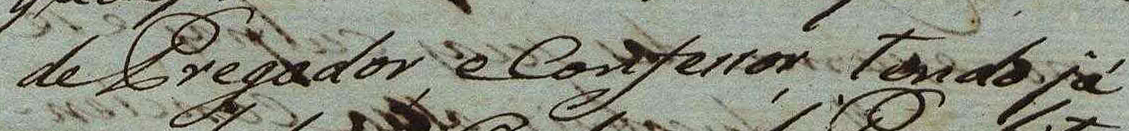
de Pregador, e Confessor, tendo já
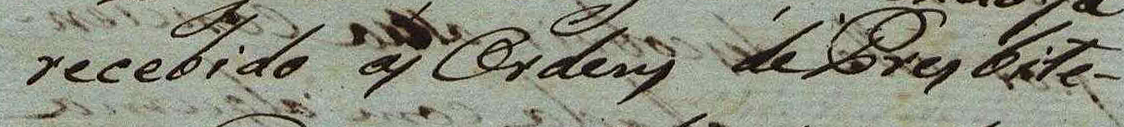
recebido as Ordens de Presbite
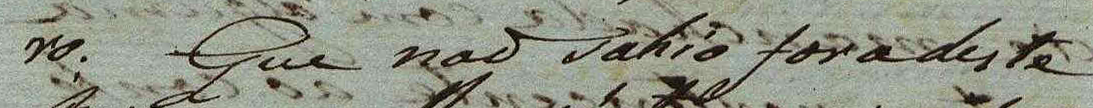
ro. Que naõ sahio fora deste
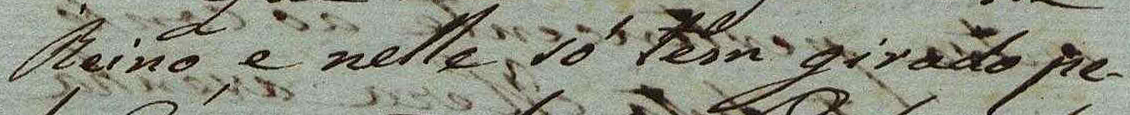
Reino, e nelle só tem girado pe
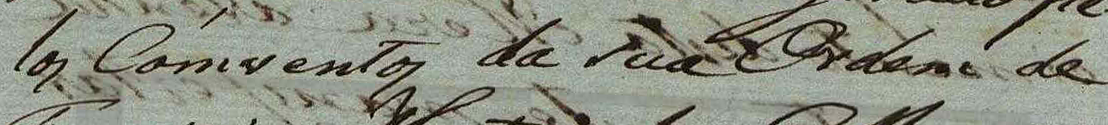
los Comventos da sua Ordem de
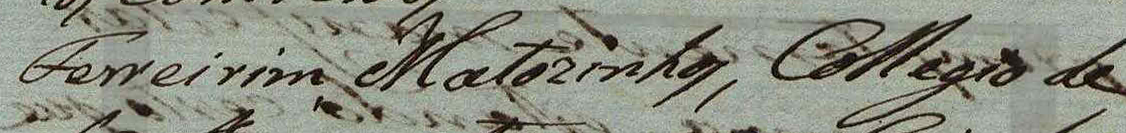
Ferreirim, Matozinhos, Collegio de
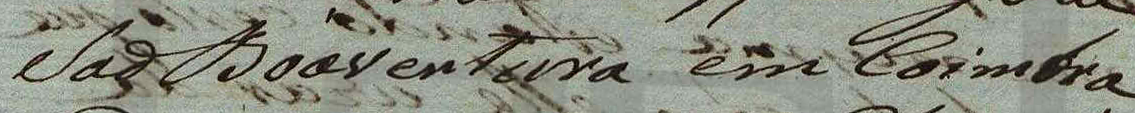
Saõ Boaventura em Coimbra,
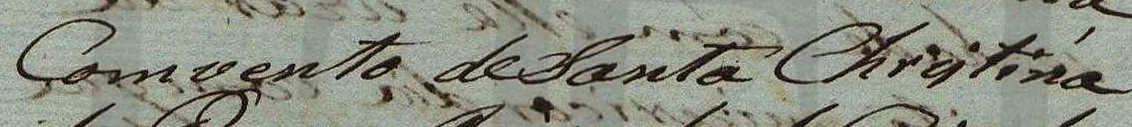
Comvento de Santa Christina
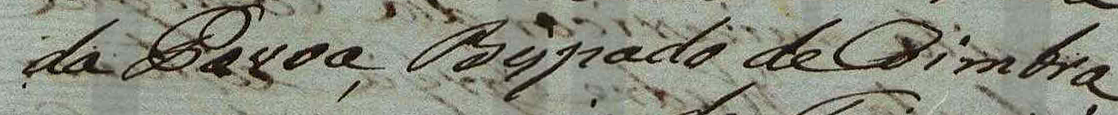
da Povoa, Bispado de Coimbra,
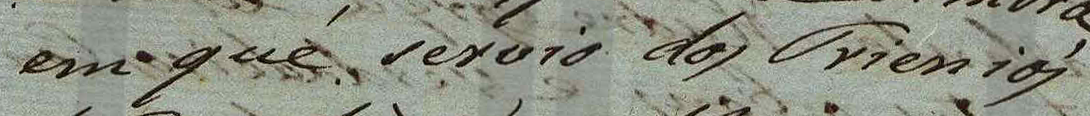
em que servio dos Trienios
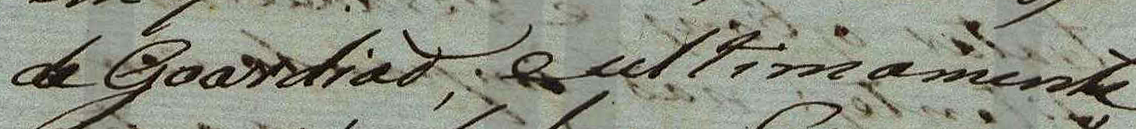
de Goardiaõ, e ultimamente
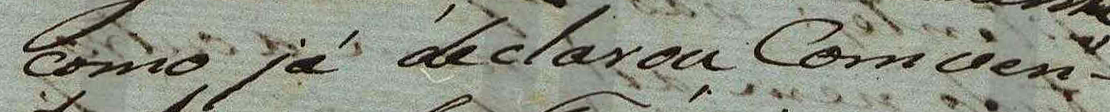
como já declarou Comven
